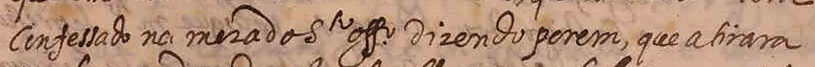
confessado na meza do sto off.o dizendo porem, que a tirara
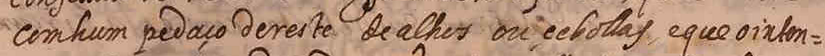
com hum pedaço de reste de alhos ou cebollas e que o inten
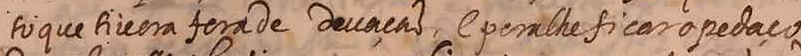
to que tiuera fora de deuaçaõ, e pera lhe ficar o pedaço
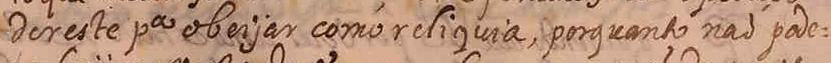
de reste pa o beijar como reliquia, porquanto naõ pode
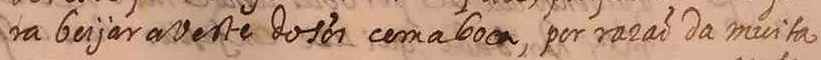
ra beijar a veste do sōr com a boca, por razaõ da muita
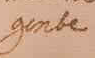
gente
